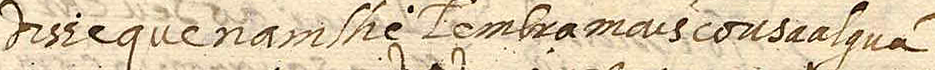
disse que nam lhe Lembra mais cousa alguā
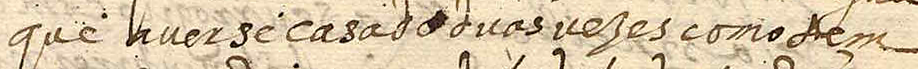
que auerse casado duas uezes como tem
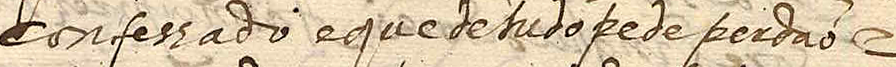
confessado e que de tudo pede perdão e
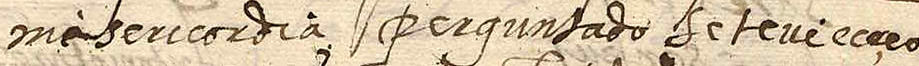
misericordia / Perguntado se teue e creo
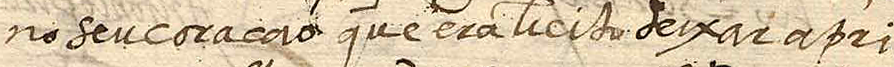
no seu coracaõ que era licito deixar a pri
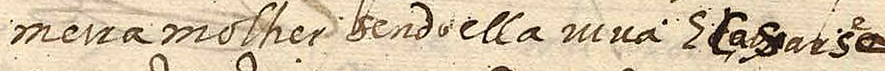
meira molher sendo ella uiua E casarse a
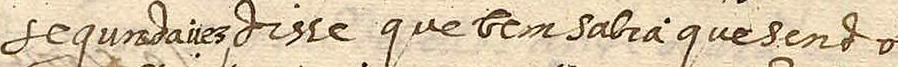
segunda uez disse que bem sabia que sendo
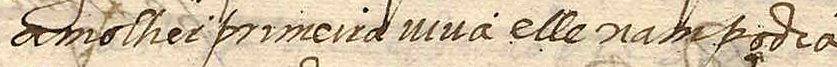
a mulher primeira uiua elle nam podia
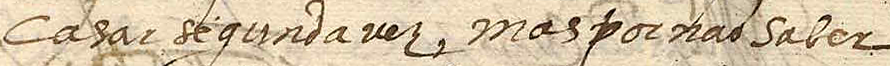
casar segunda uez, mas por naõ saber
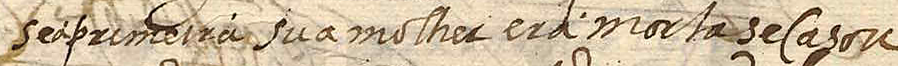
se a primeiria sua mulher era morta se Casou
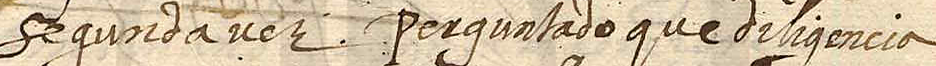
segunda uez. Perguntado que diligencia
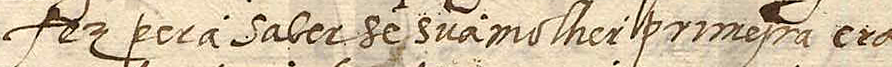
fez pera saber se sua molher primejra era
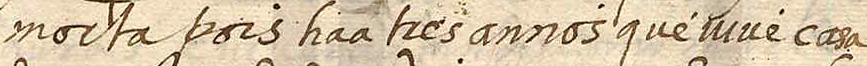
morta pois haa tres annos que uiue casa
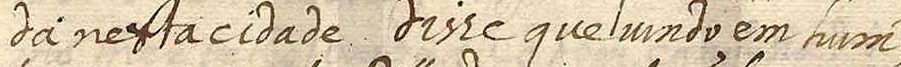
da nesta cidade disse que uindo em hum̄,
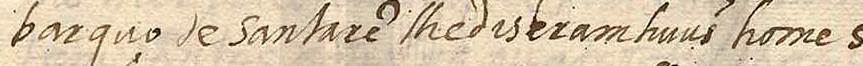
barquo de santarē lhe diseram huus̄ homes
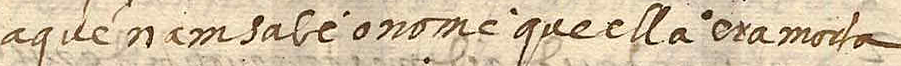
a quē nem sabe o nome que ella era morta
